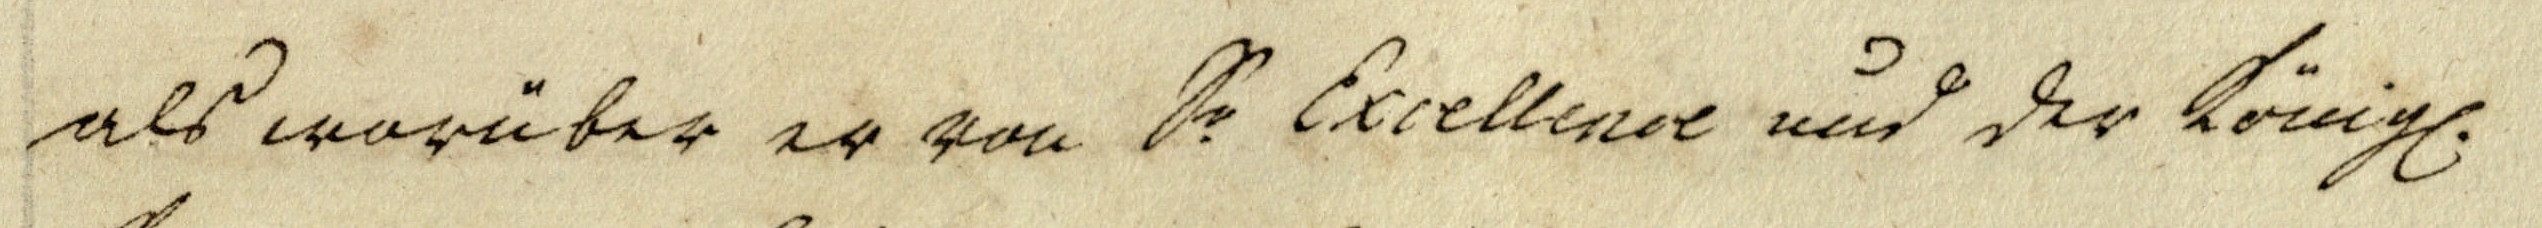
als worüber er von Sr Excellence und der Königl.
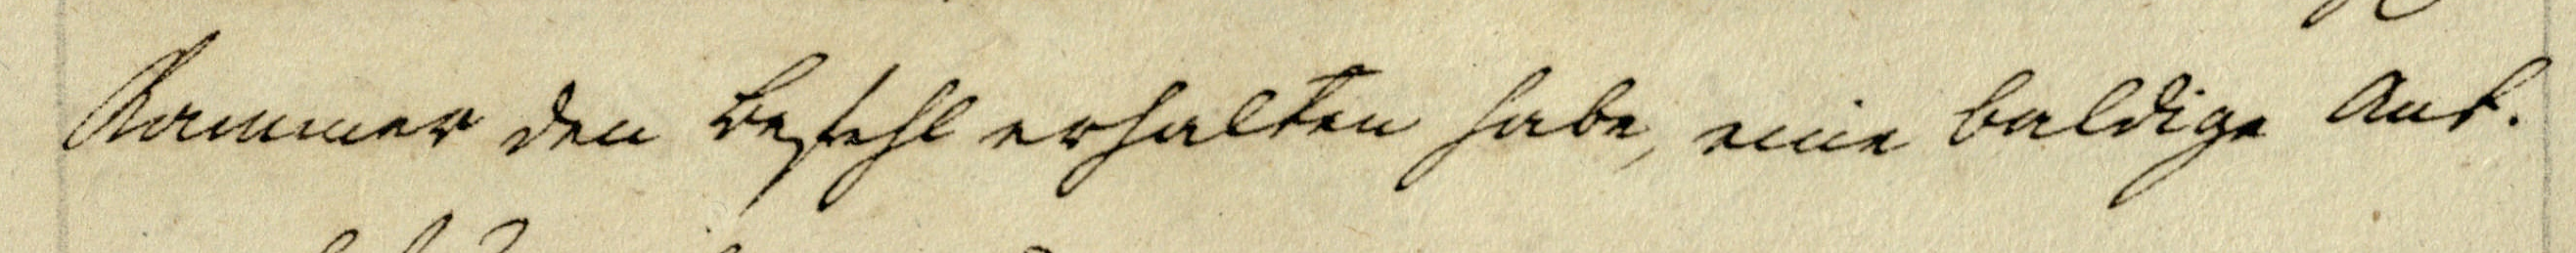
Kammer den Befehl erhalten habe, eine baldige Ant¬
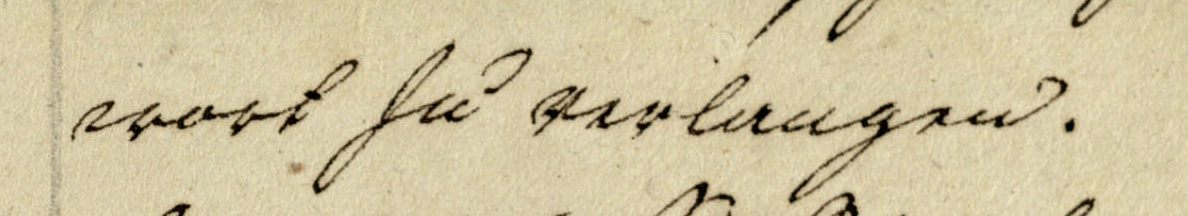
wort zu verlangen.
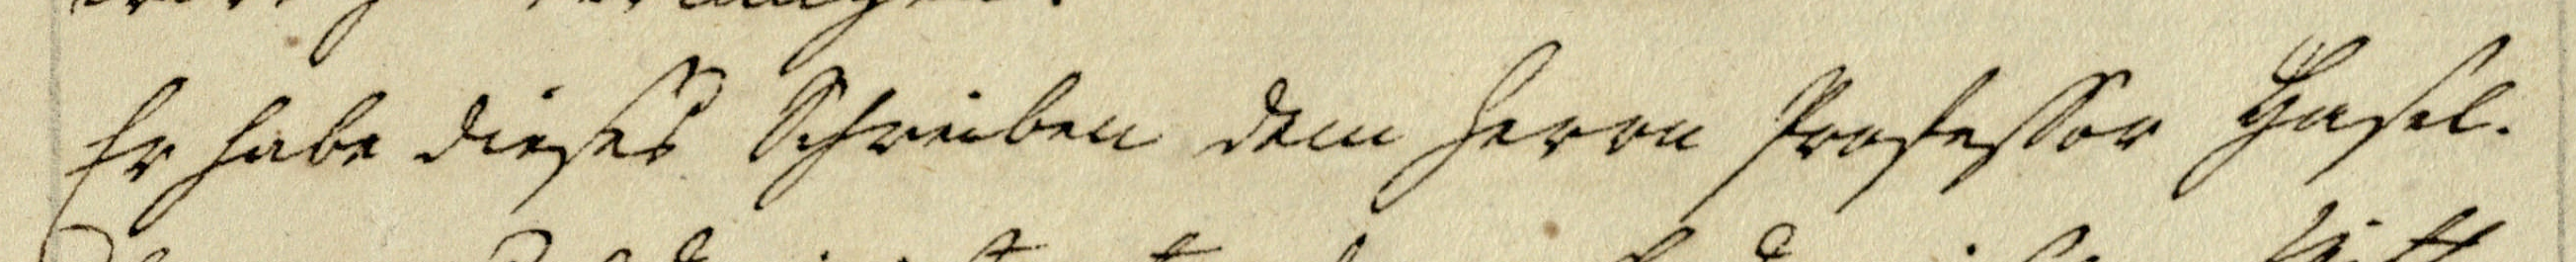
Er habe dieses Schreiben dem Herrn Professor Hasel¬
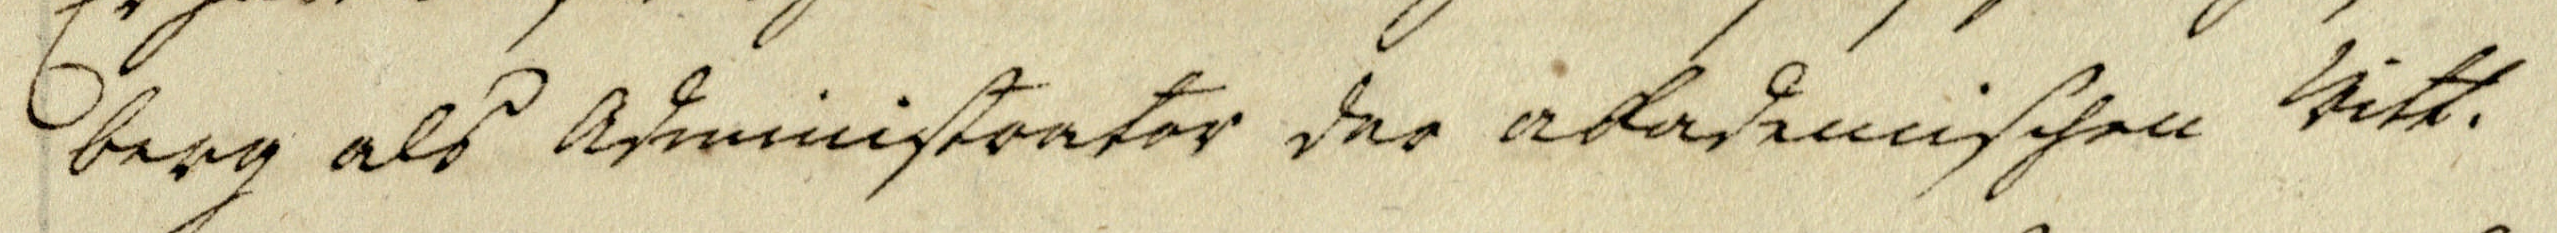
berg als Administrator der akademischen Witt¬
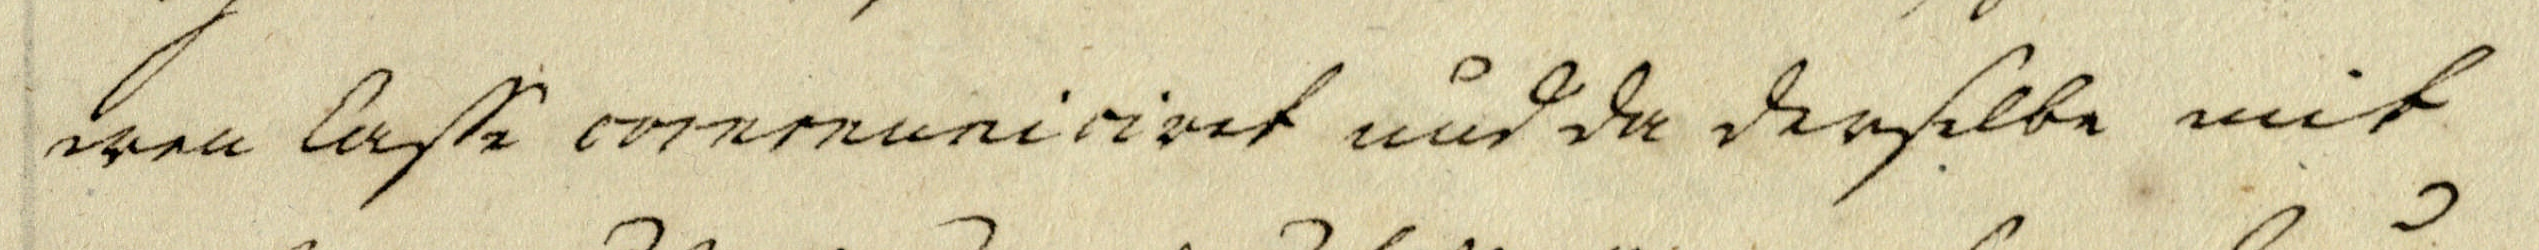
wen Casse communiciret und da derselbe mit
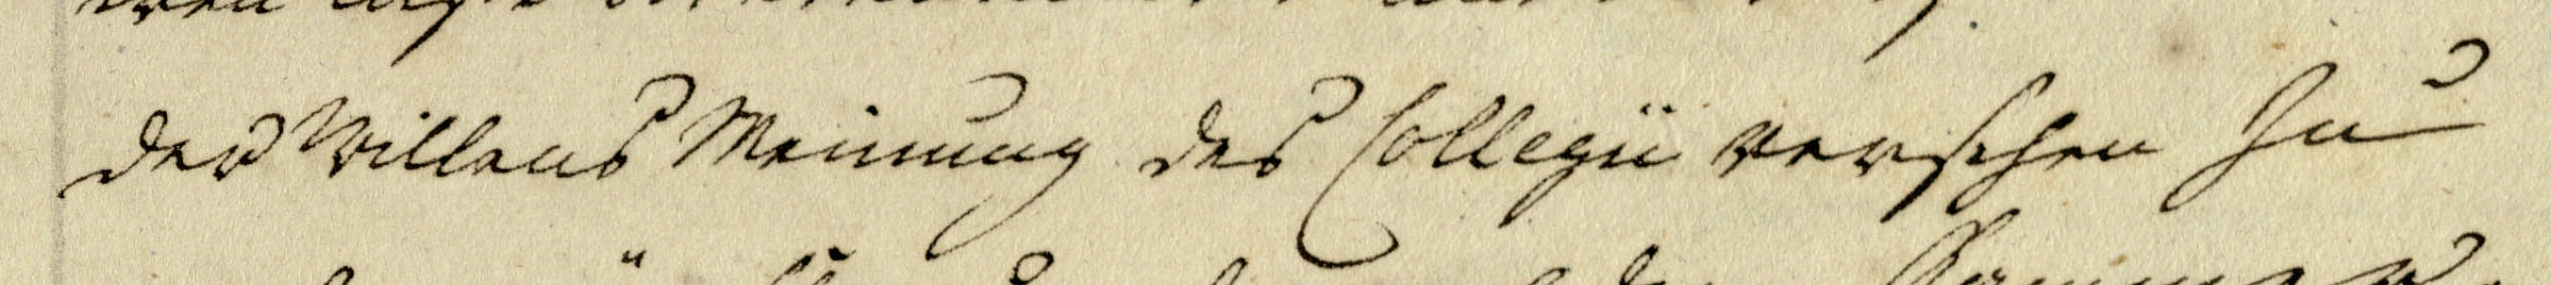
der Willens Meinung des Collegii versehen zu
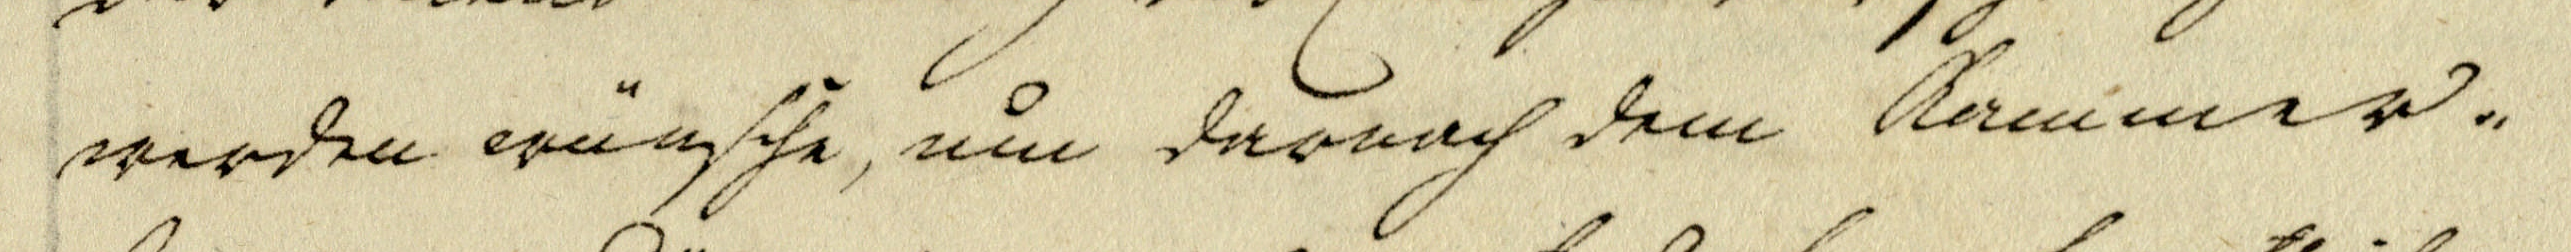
werden wünsche, um darnach dem Kammer¬
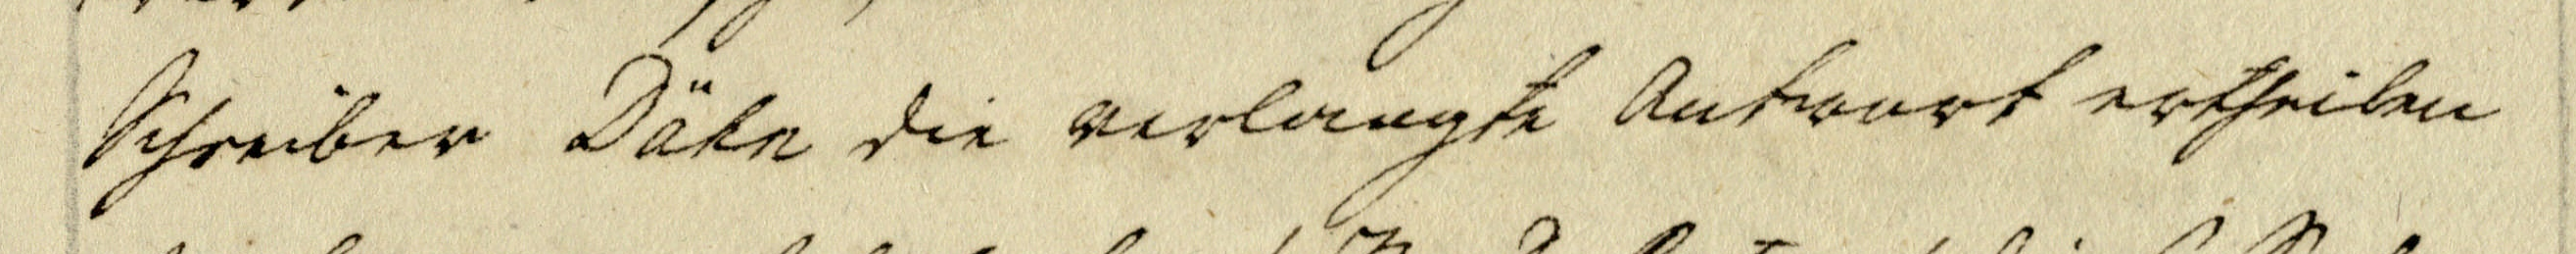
Schreiber Dähn die verlangte Antwort ertheilen
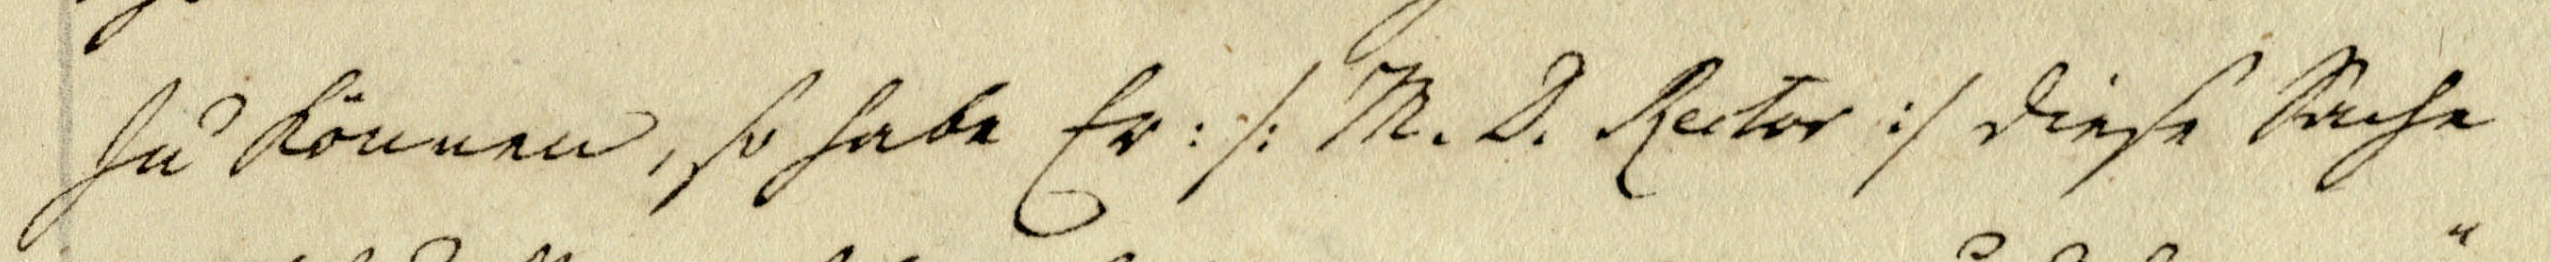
zu können, so habe Er: /: M. D. Rector :/ diese Sache
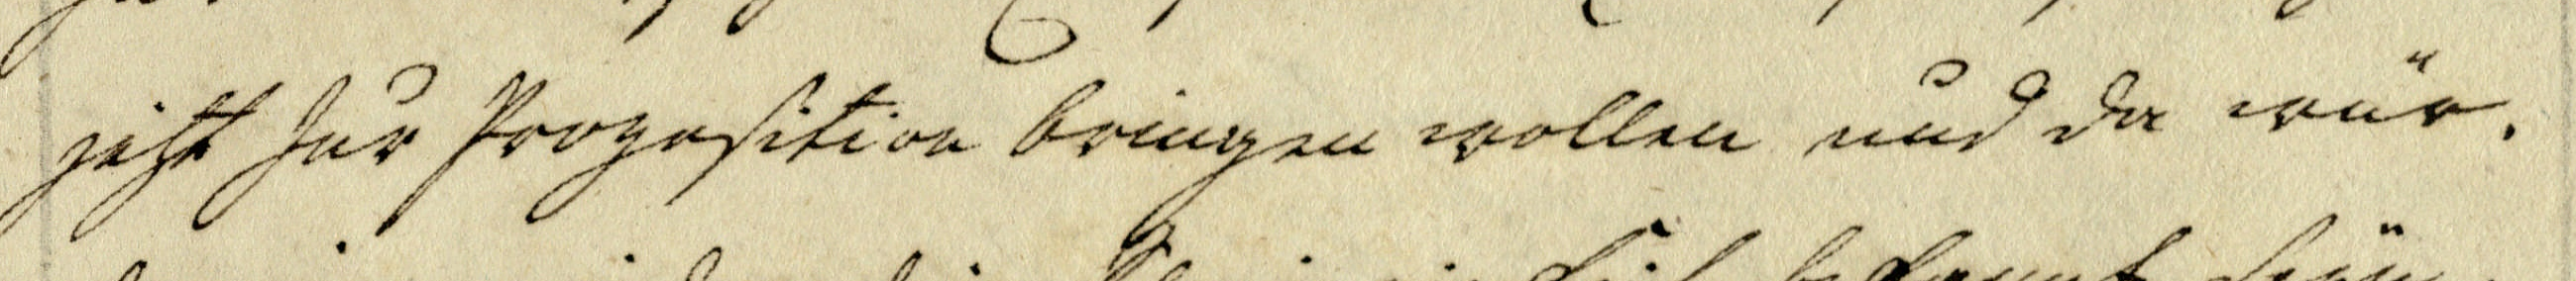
jetzt zur Proposition bringen wollen und da wür¬
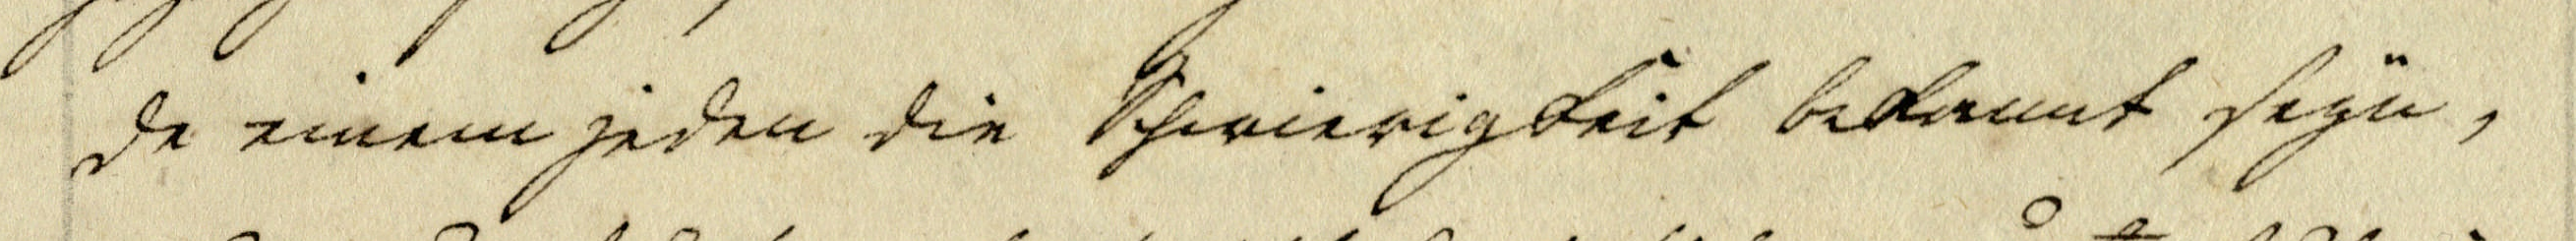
de einem jeden die Schwierigkeit bekannt seÿn,
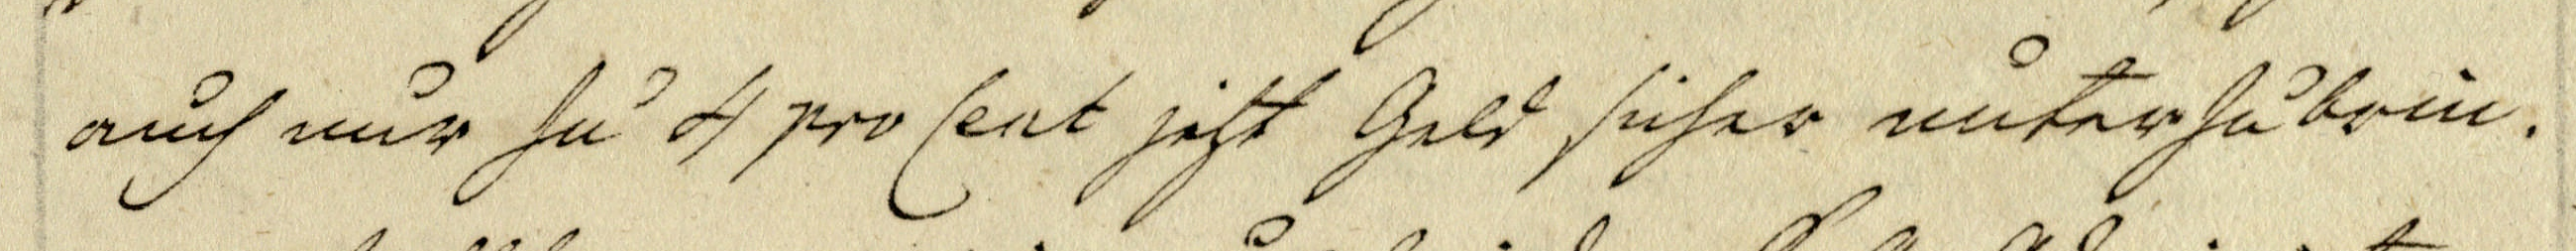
auch nur zu 4 pro Cent jetzt Geld sicher unterzubrin¬
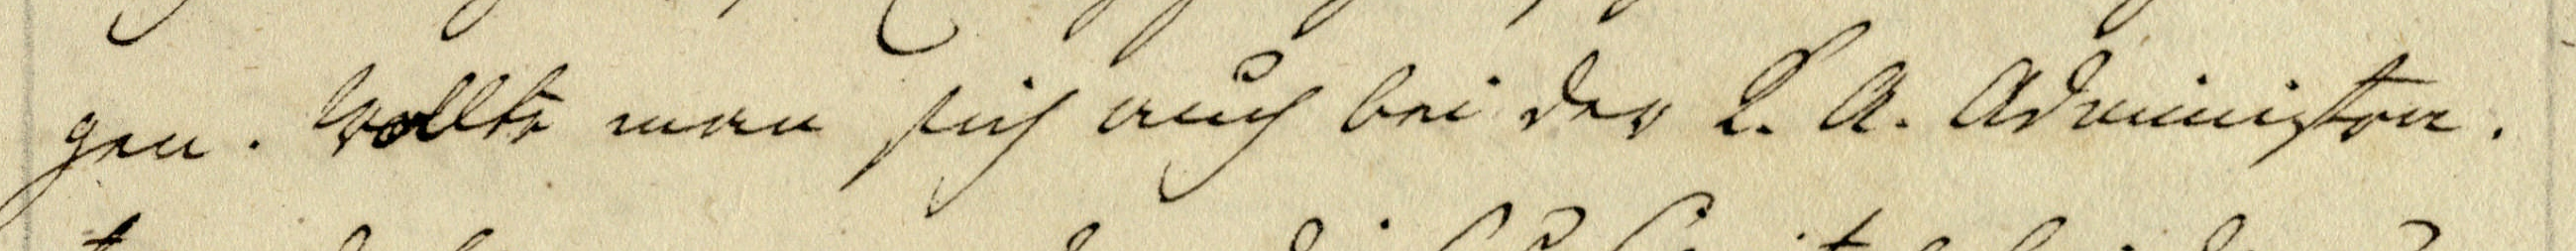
gen. Wollte man sich auch bei der K. A. Administra¬
